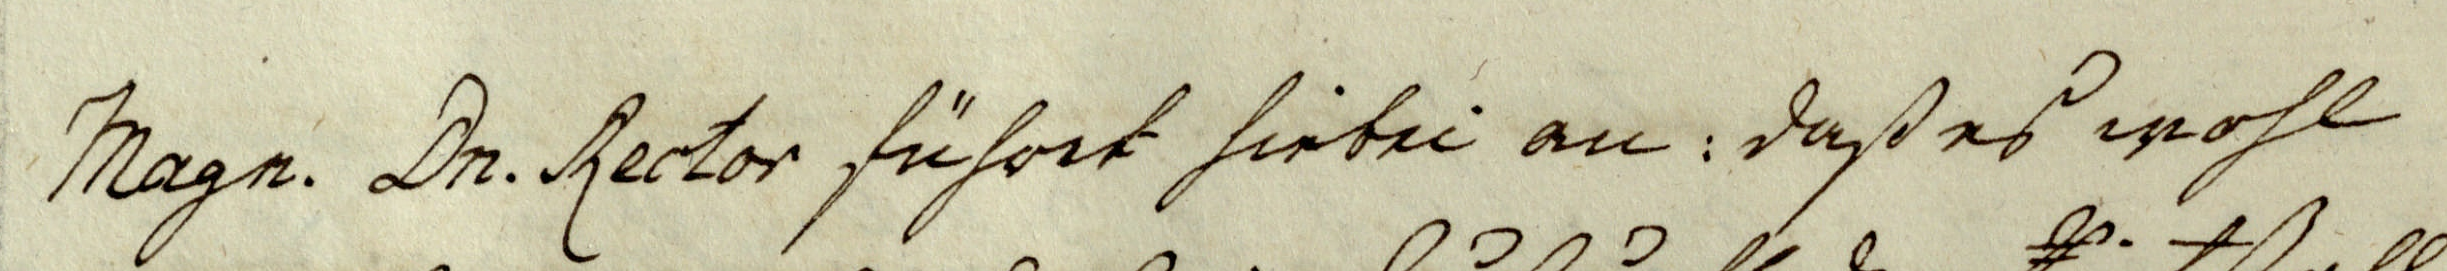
Magn. Dn. Rector führt hiebei an: daß es wohl
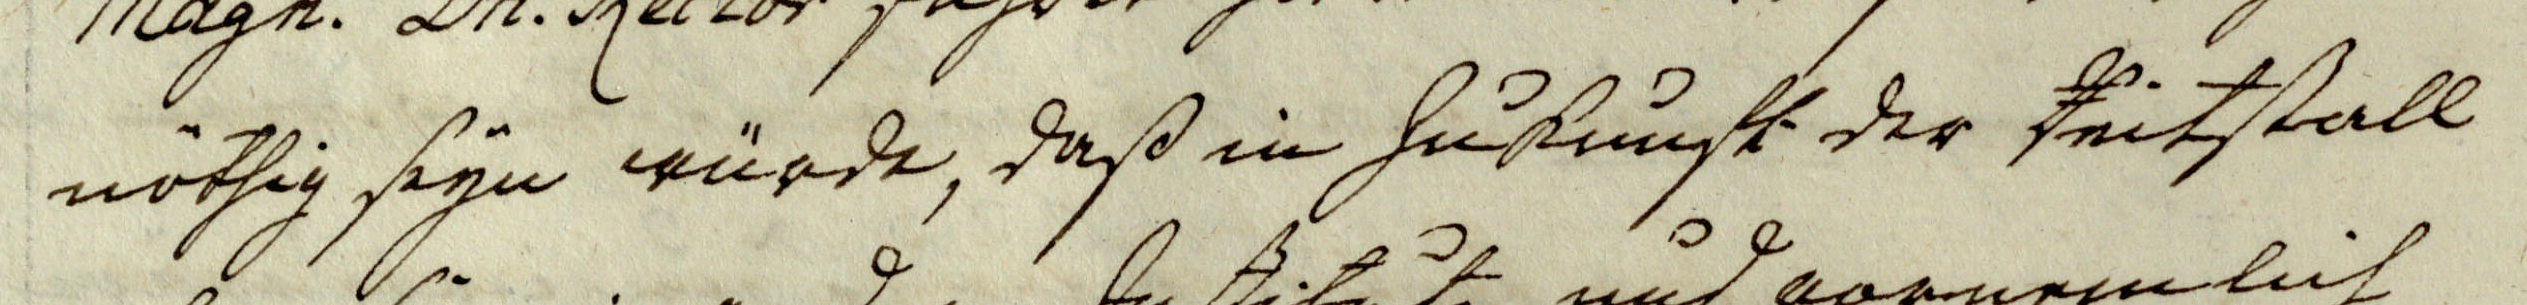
nöthig seÿn würde, daß in Zukunft der Reitstall
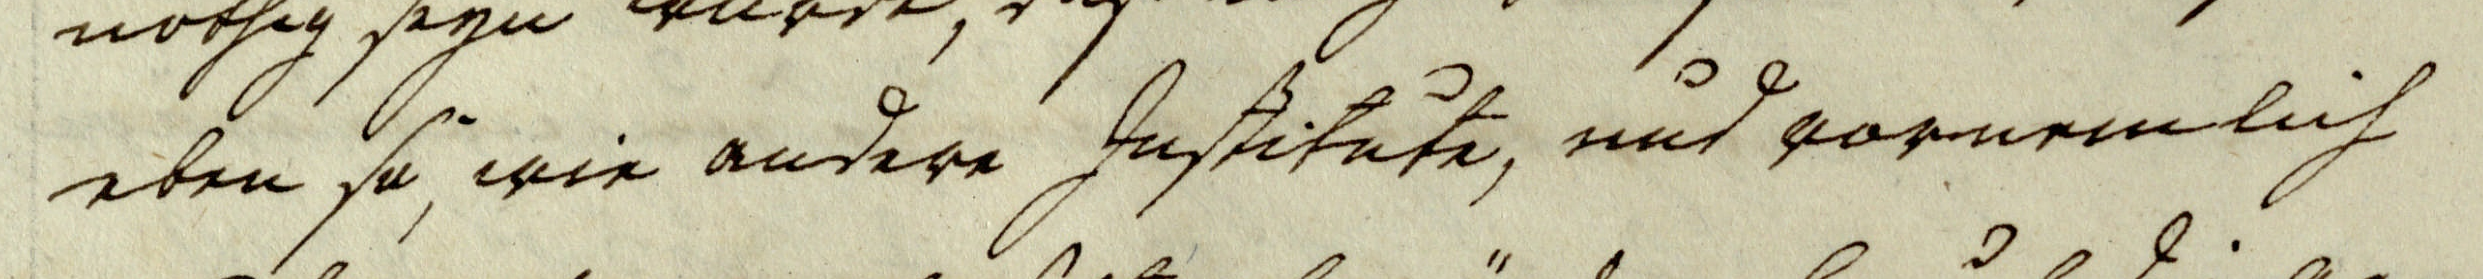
eben so, wie andere Institute, und vornemlich
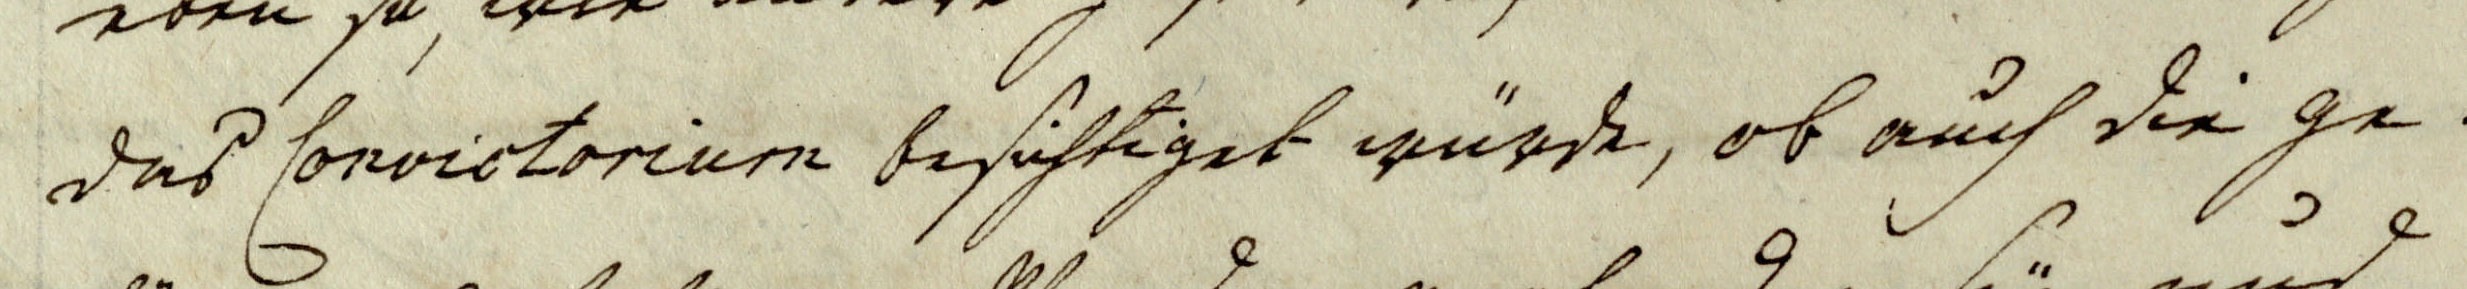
das Convictorium besichtiget würde, ob auch die ge
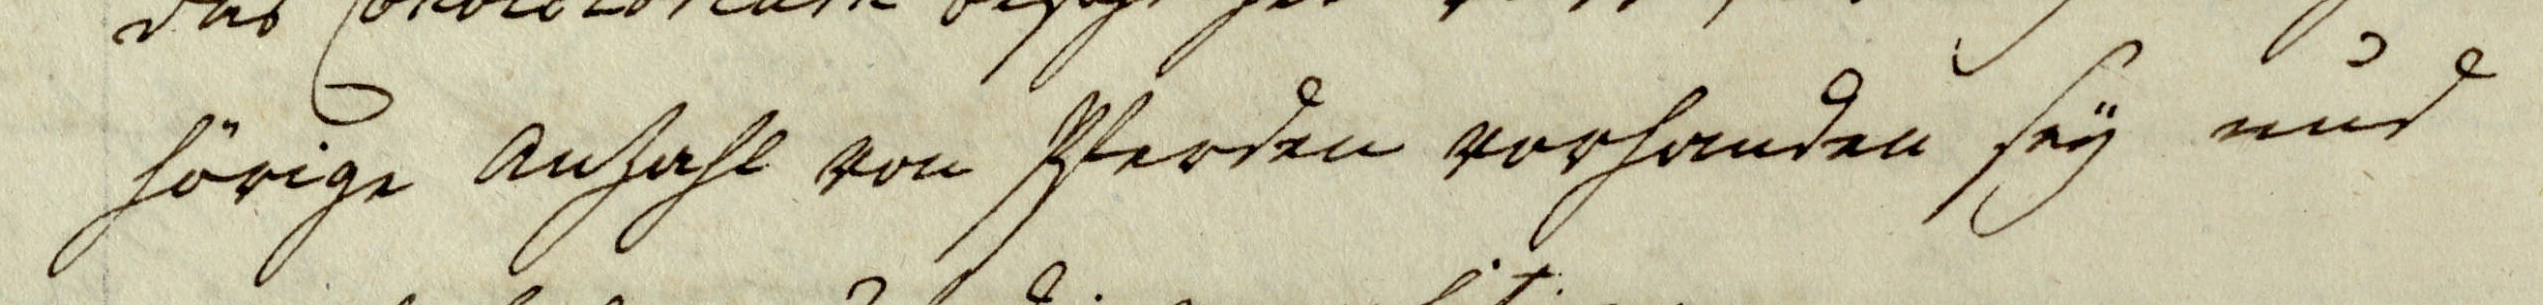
hörige Anzahl von Pferden vorhanden seÿ und
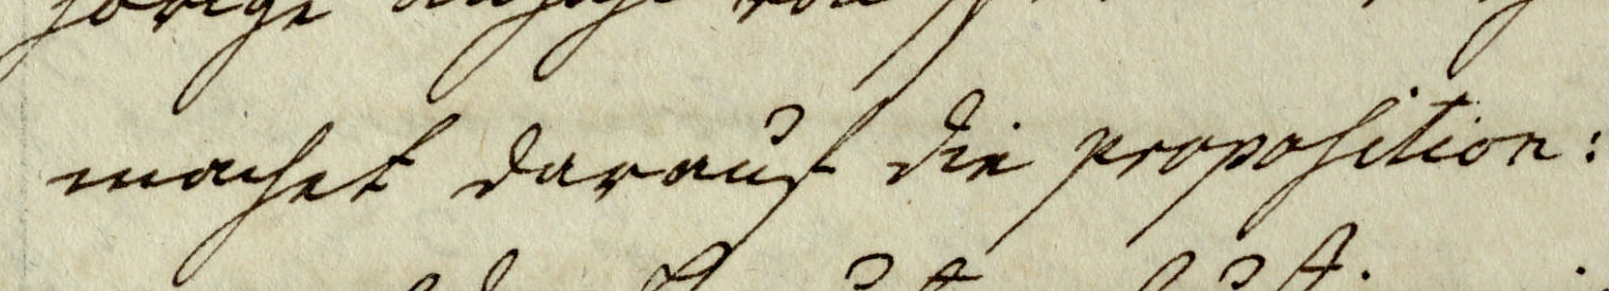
machet darauf die proposition:
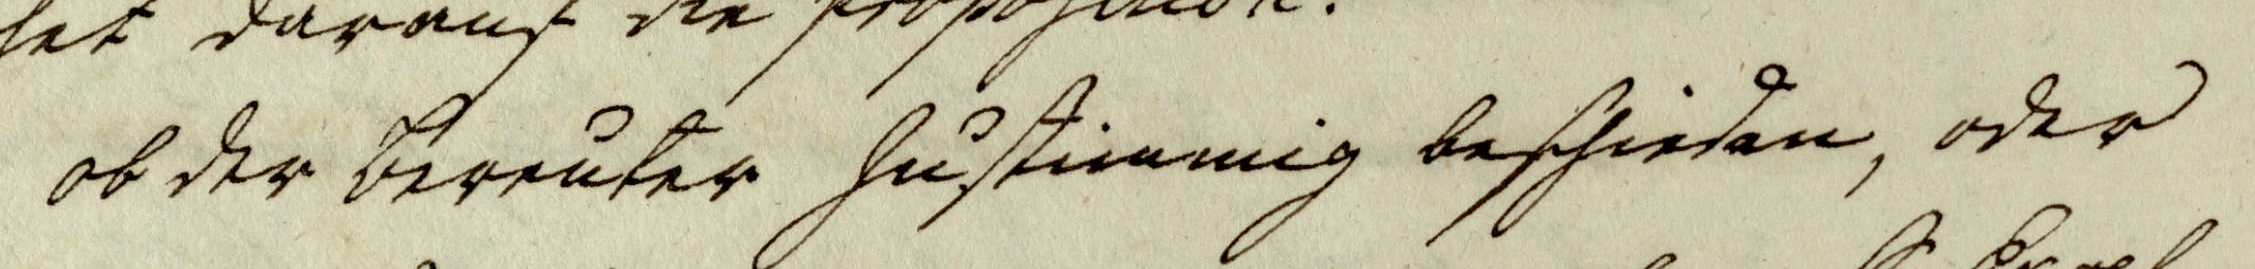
ob der Bereuter zustimmig beschieden, oder
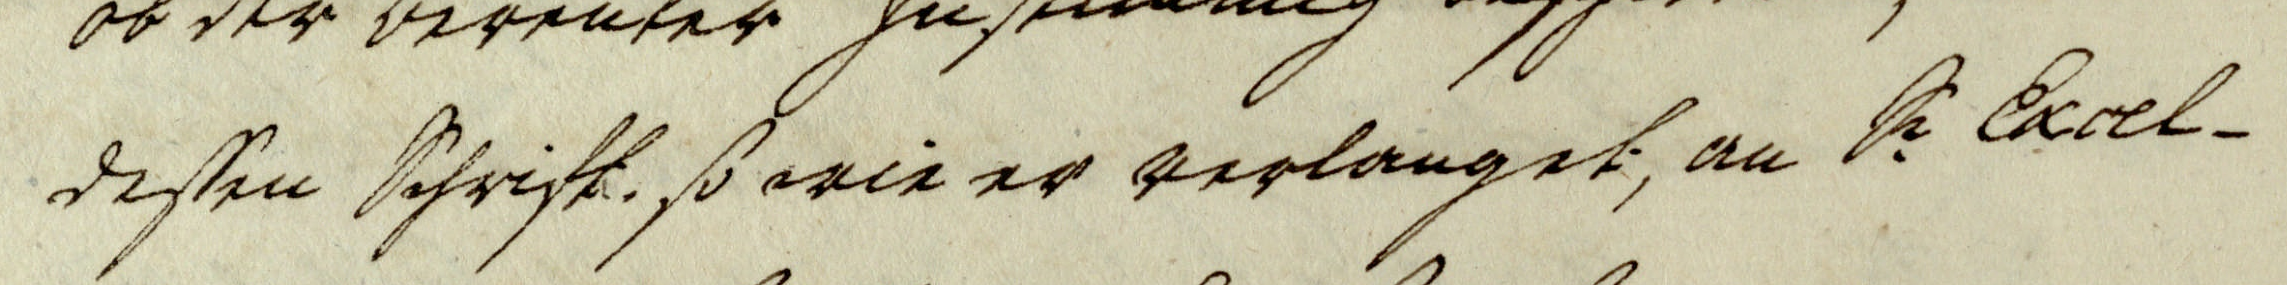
dessen Schrift, so wie er verlanget, an Sr. Excel¬
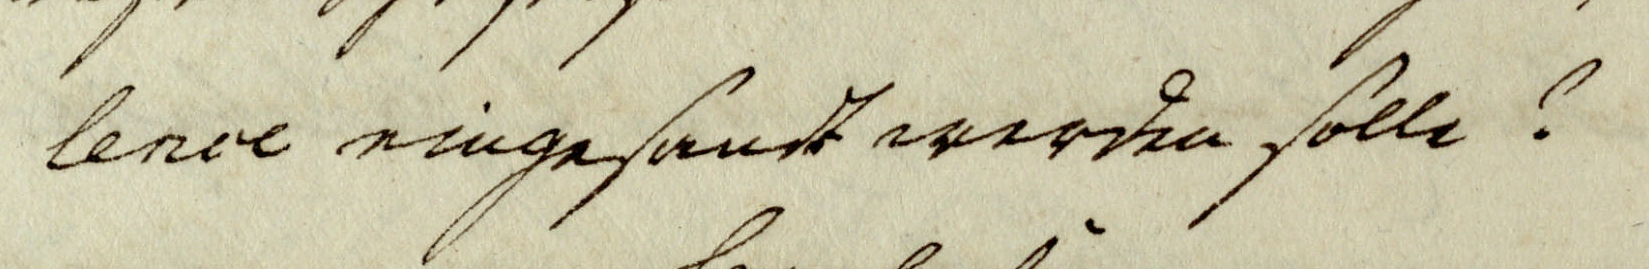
lence eingesandt werden solle?
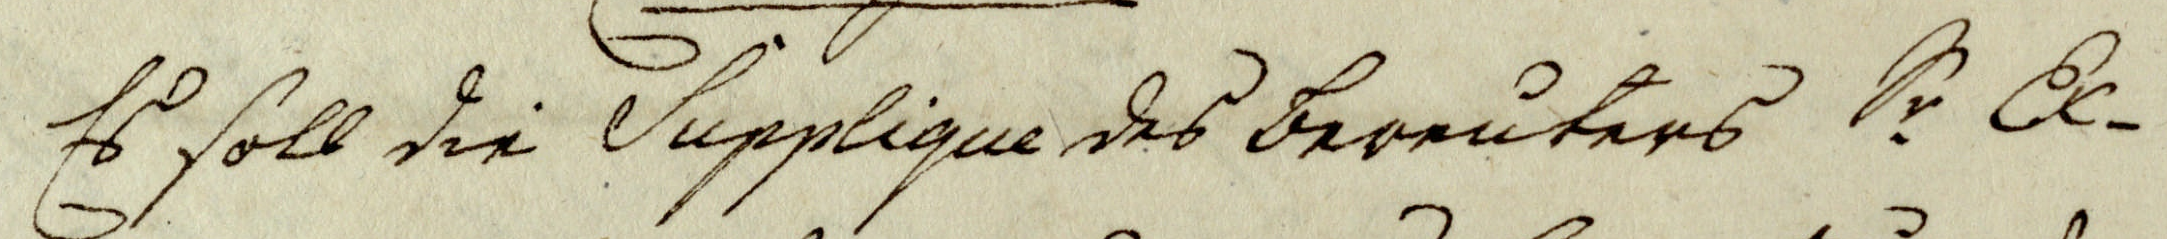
Es soll die Supplique des Bereuters Sr. Ex¬
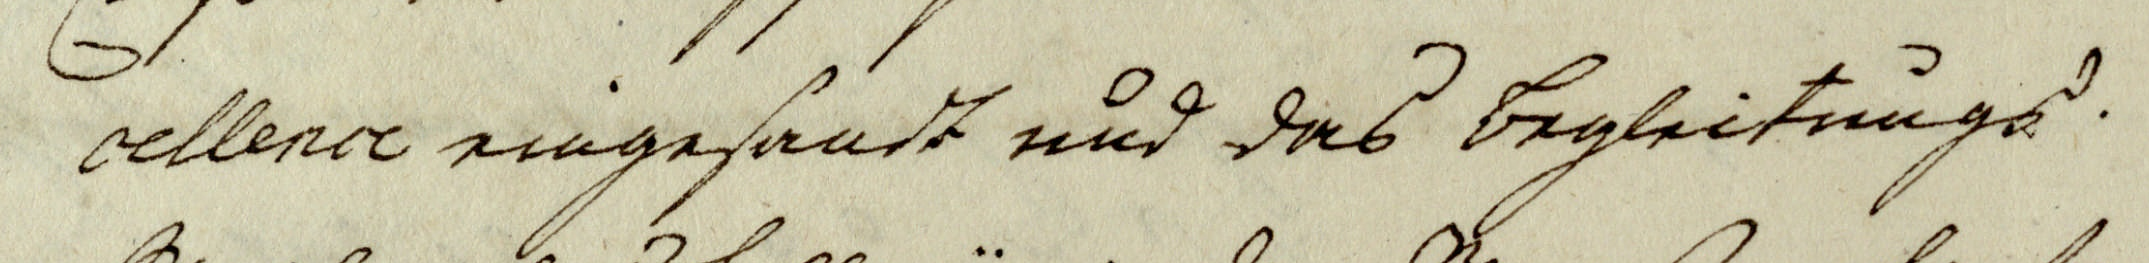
cellence eingesandt und das Begleitungs¬
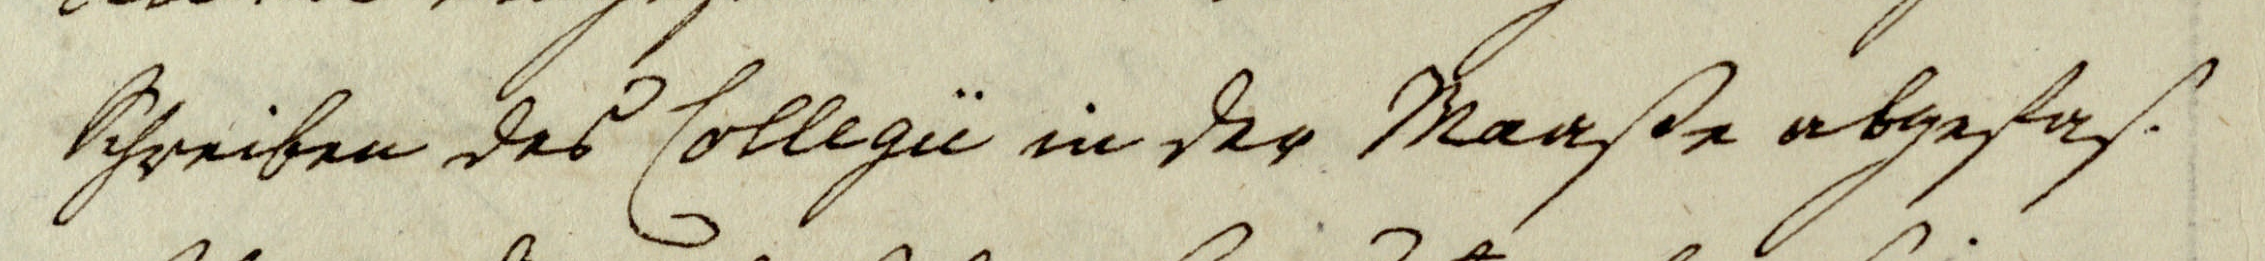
Schreiben des Collegii in der Maaße abgefas¬
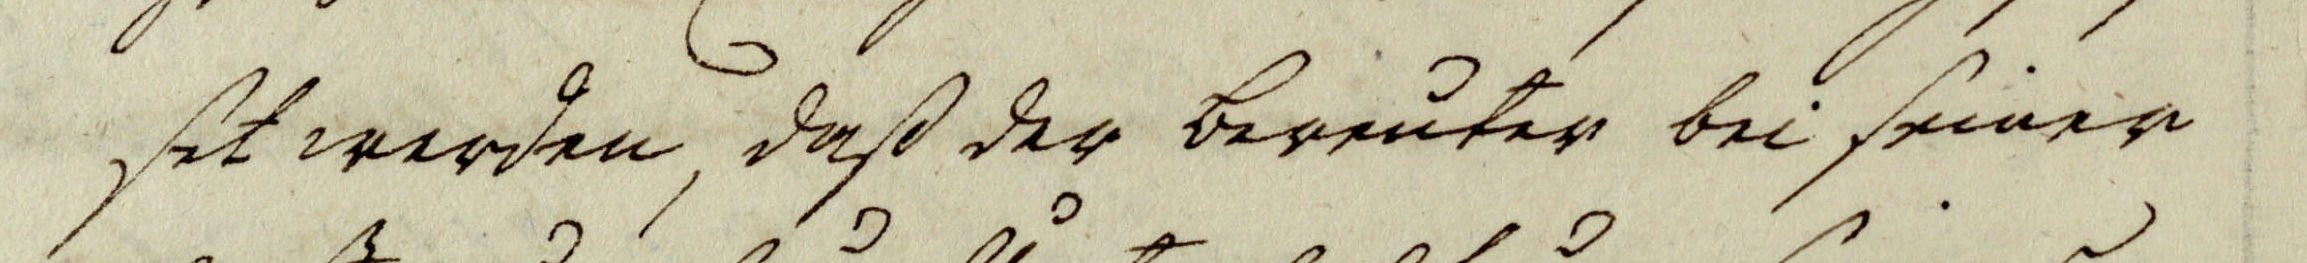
set werden, daß der Bereuter bei seiner
